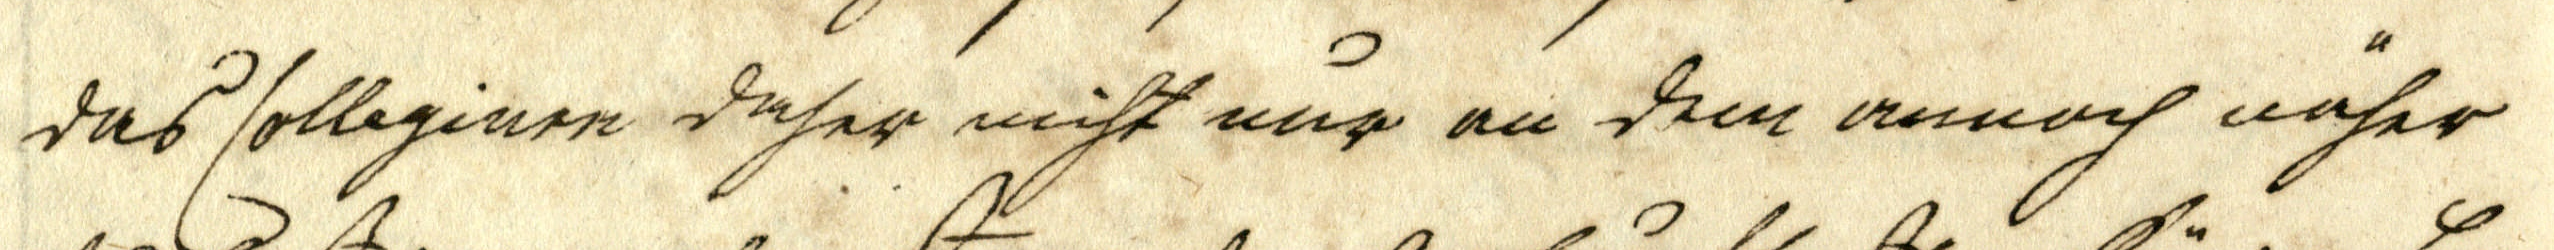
das Collegium daher nicht nur an dem annoch näher
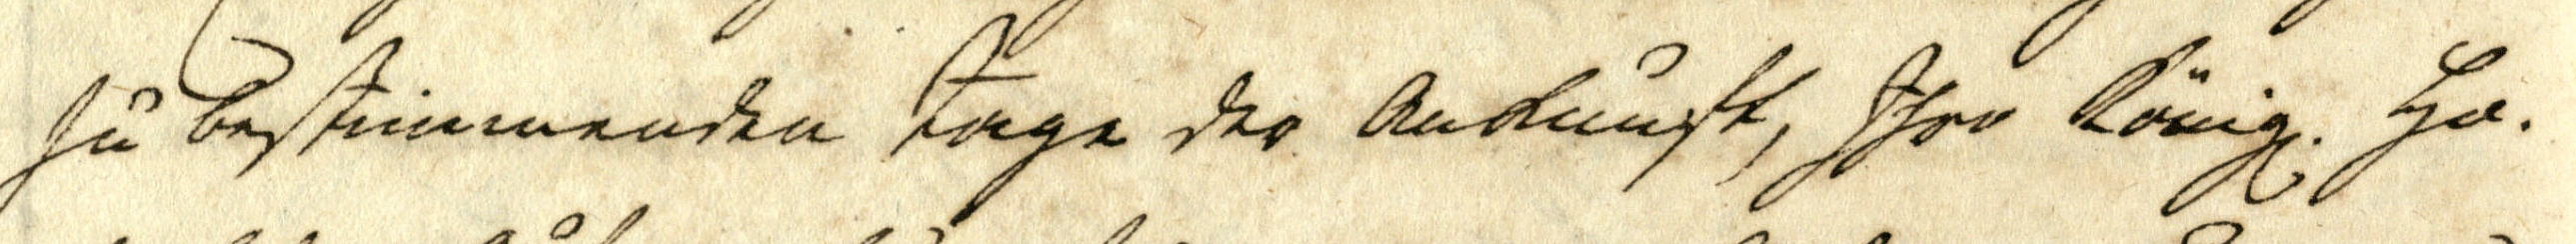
zu bestimmenden Tage der Ankunft, so Königl. Ho¬
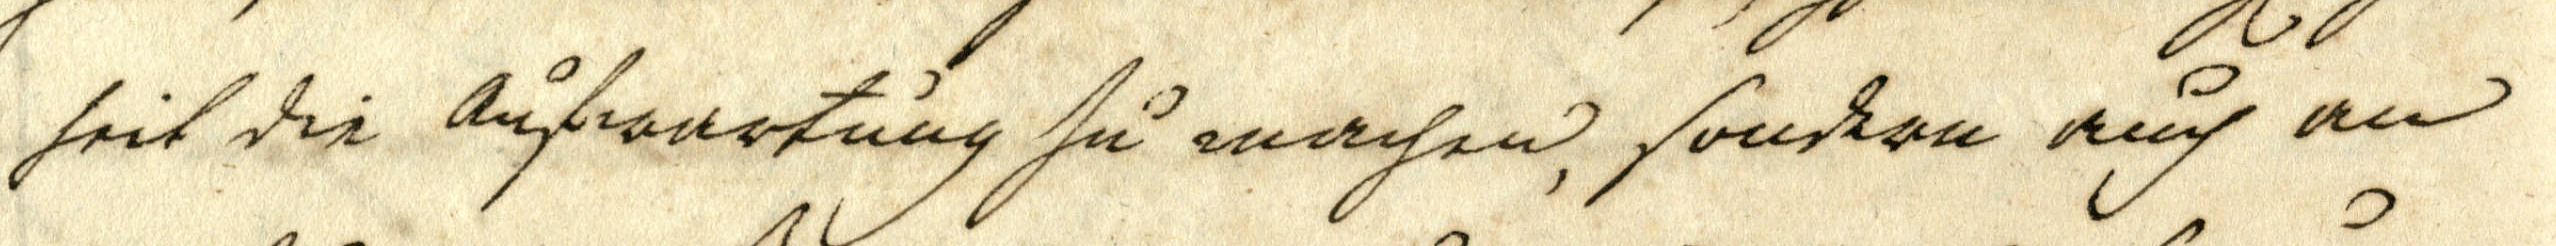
heit die Aufwartung zu machen, sondern auch an
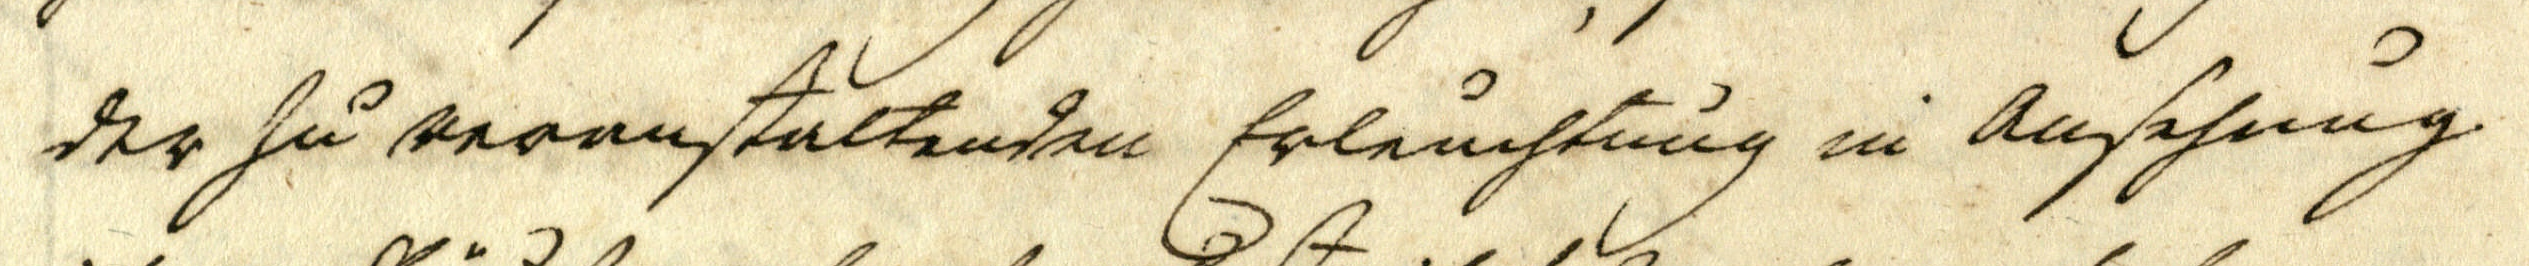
der zu veranstaltenden Erleuchtung in Ansehung
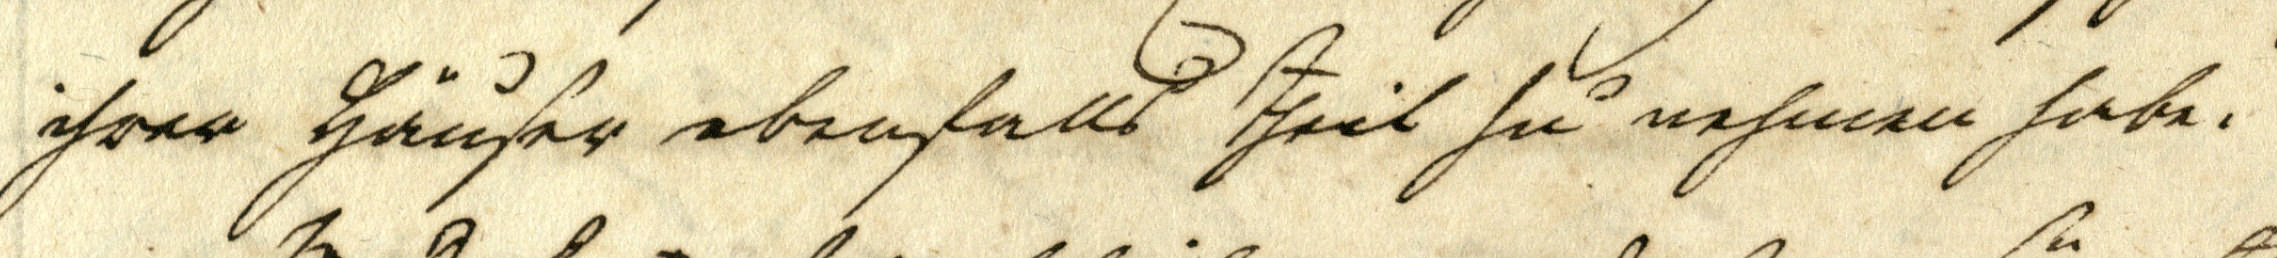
ihre Häuser ebenfalls Theil zu nehmen habe.
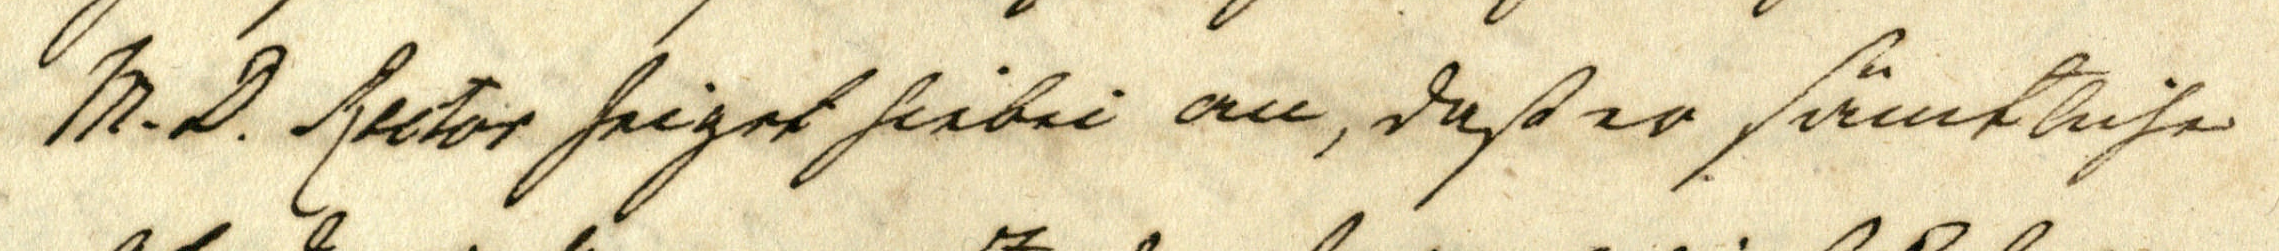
M. D. Rector zeiget hiebei an, daß er sämtliche
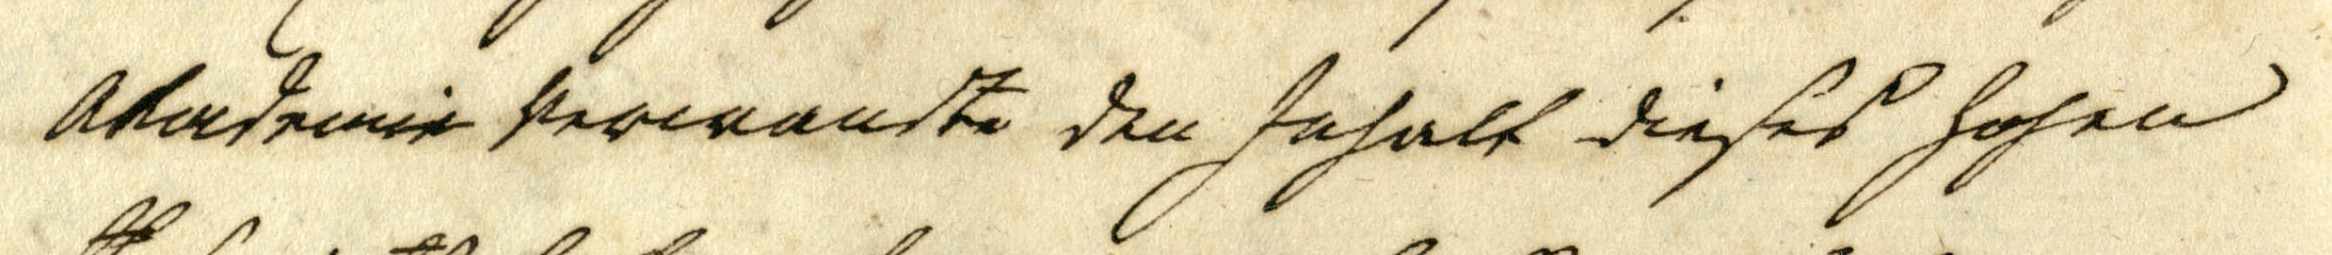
Akademie Verwandte den Inhalt dieses hohen
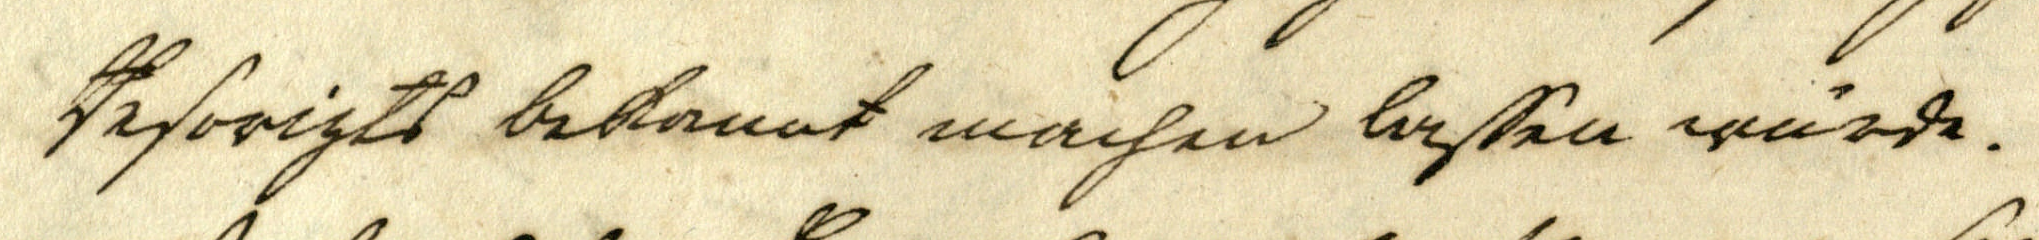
Rescripts bekannt machen lassen würde.
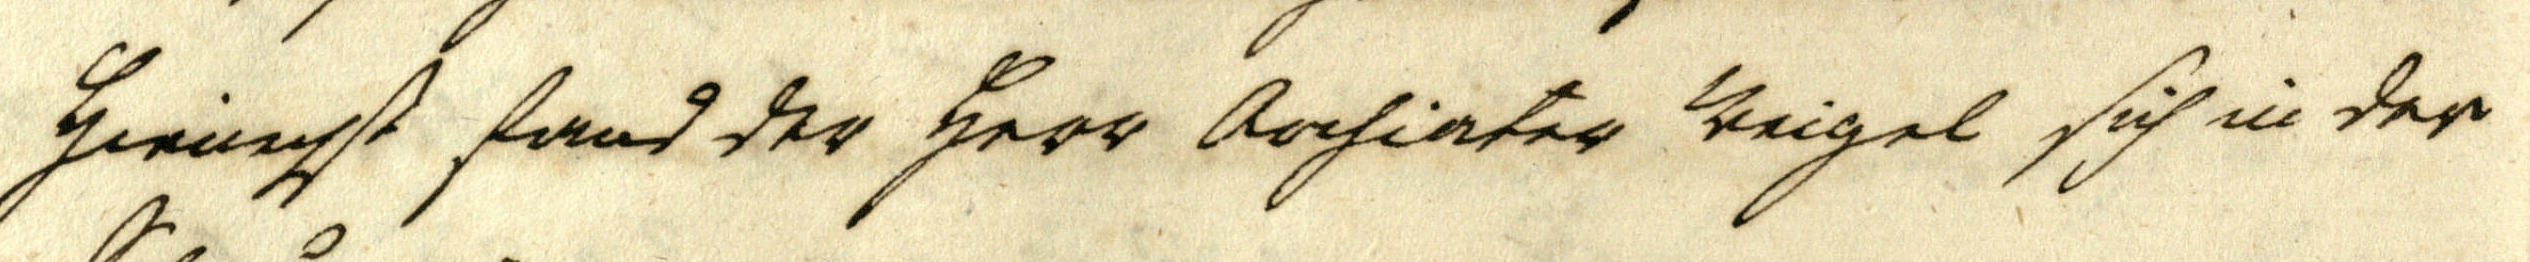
Hienechst fand der Herr Archiater Weigel sich in der
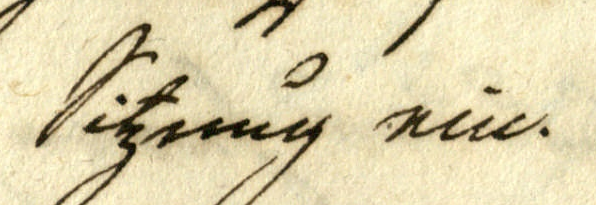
Sitzung ein.
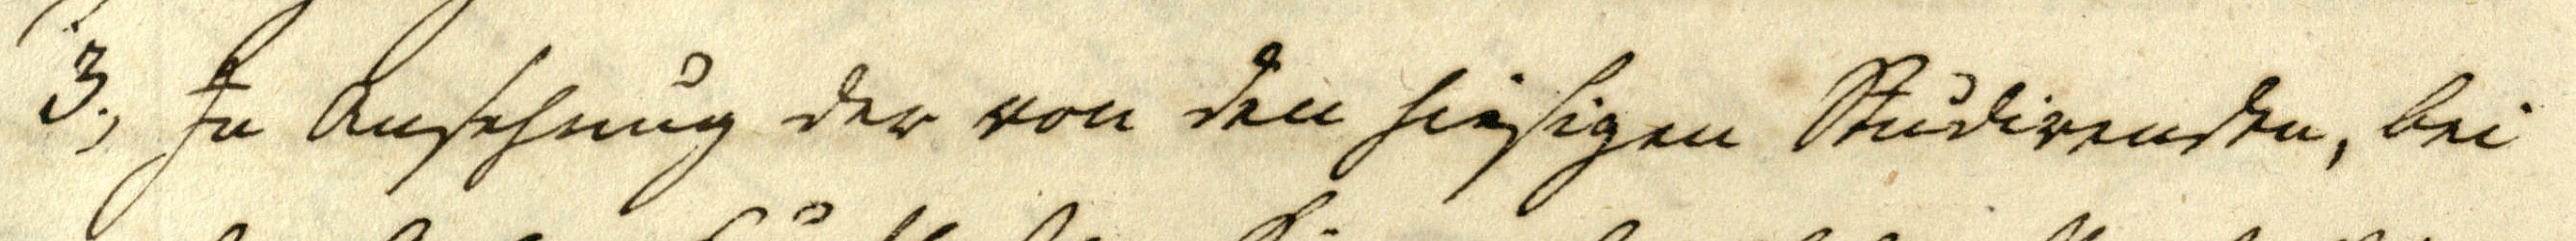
3., In Ansehung der von den hiesigen Studirenden, bei
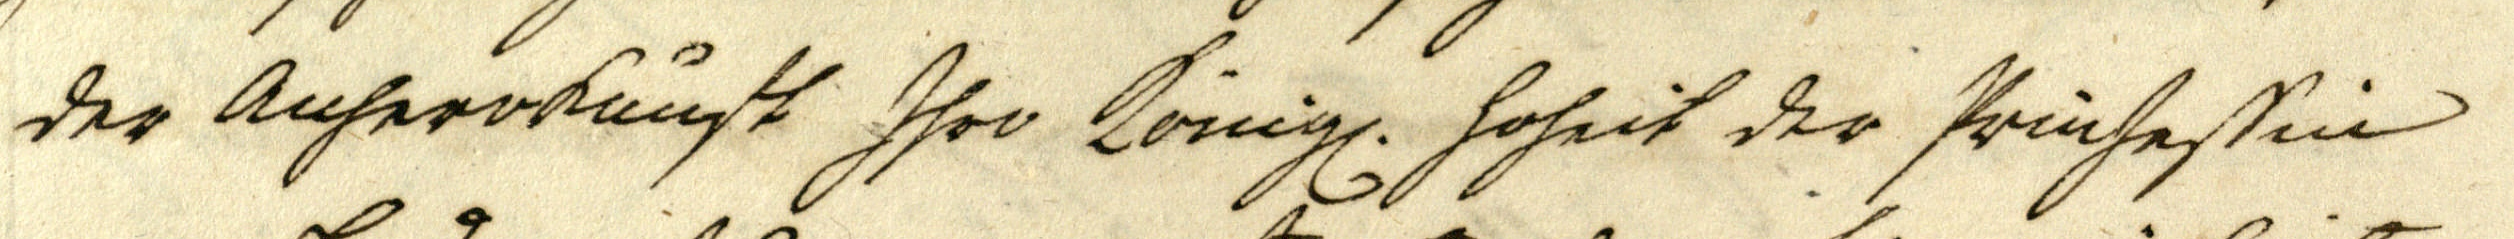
der Anherokunft Ihro Königl. Hoheit der Prinzessin
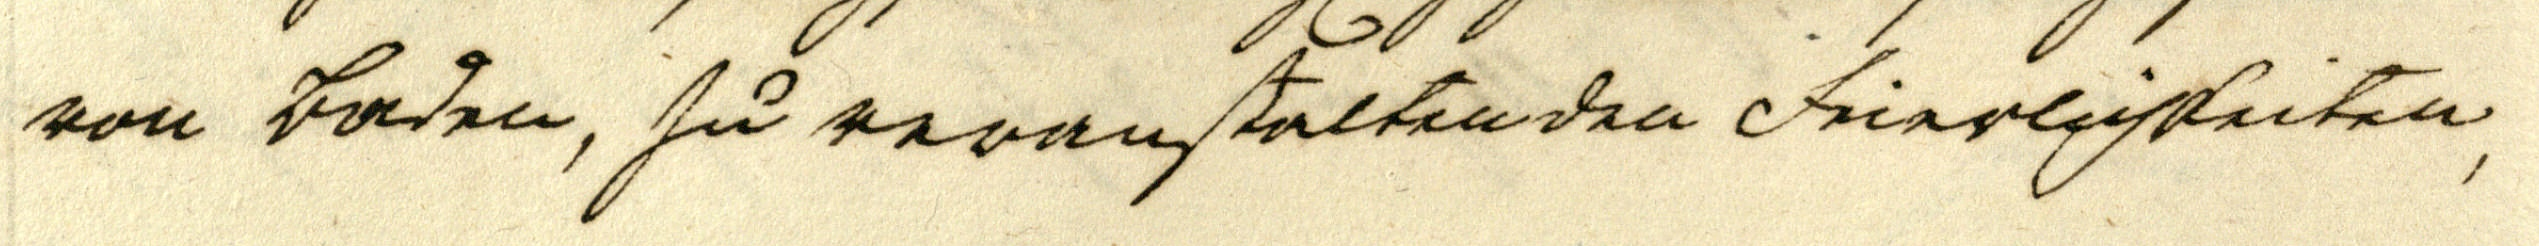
von Baden, zu veranstaltenden Feierlichkeiten,
